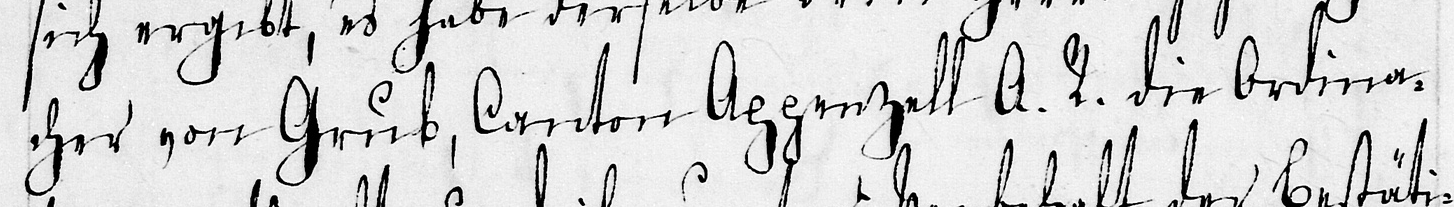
cher von Grub, Canton Appenzell A. R. die Ordina¬
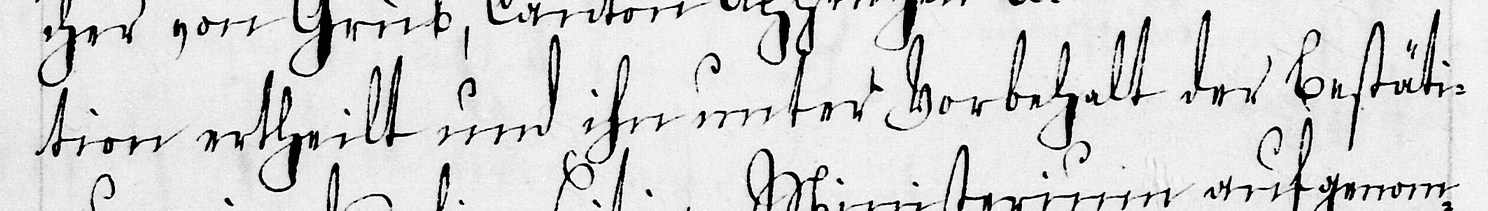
tion ertheilt und ihn unter Vorbehalt der Bestäti¬
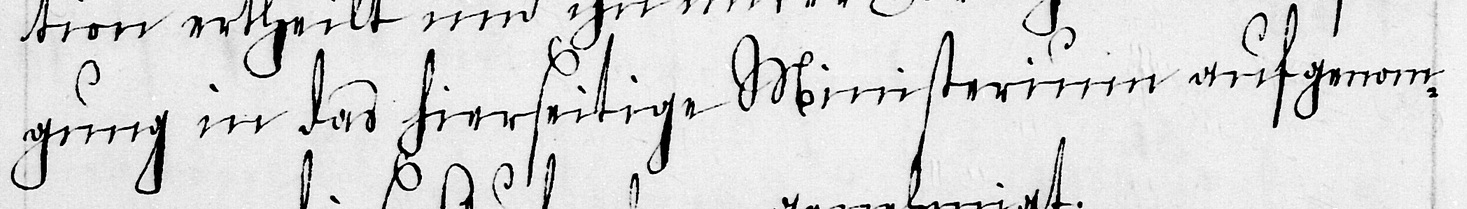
gung in das hierseitige Ministerium aufgenom¬
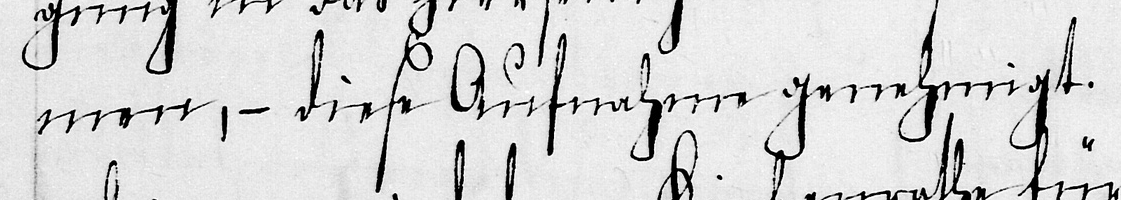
men, – diese Aufnahme genehmigt.
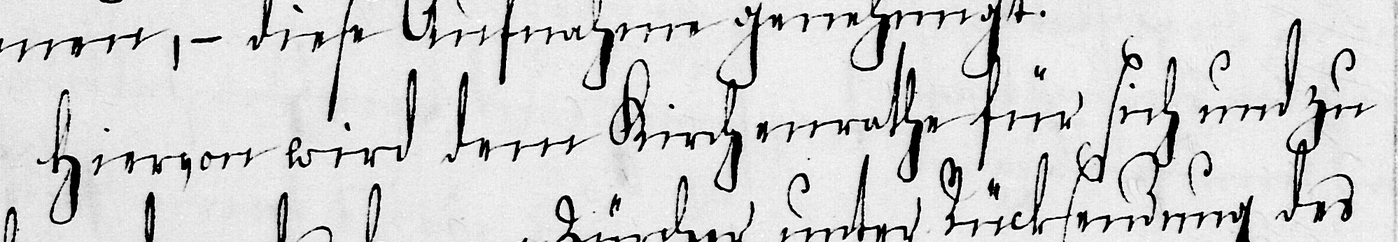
Hiervon wird dem Kirchenrathe für sich und zu
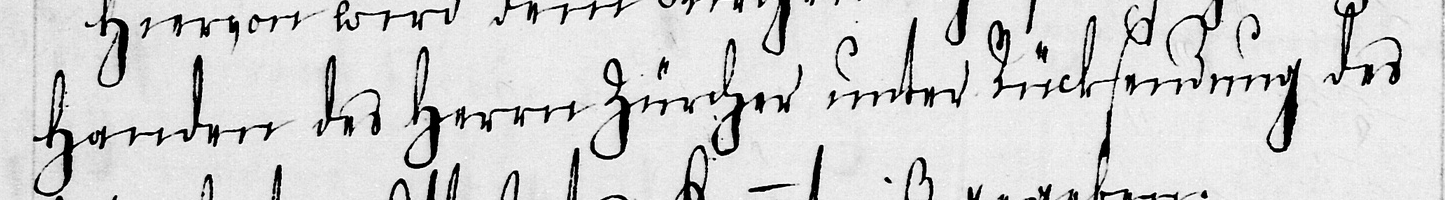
Handen des Herrn Zürcher unter Rücksendung des
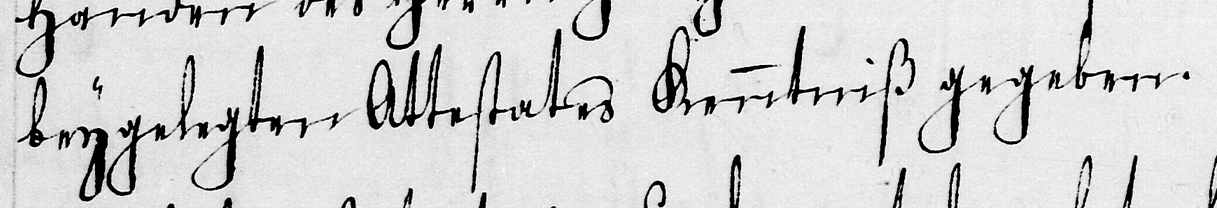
beygelegten Attestates Kenntniß gegeben.
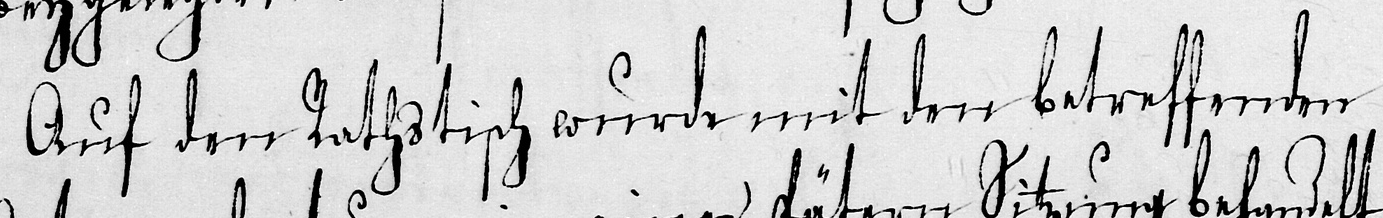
Auf den Rathstisch wurde mit den betreffenden
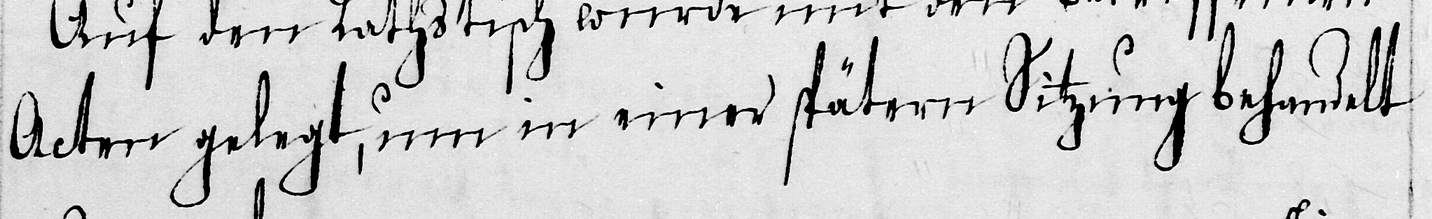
Acten gelegt, um in einer spätern Sitzung behandelt
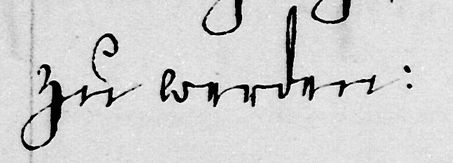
zu werden:
